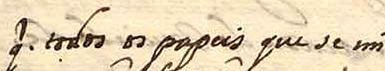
q̄. todos os papeis que se im
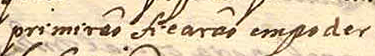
primirão ficarão em poder
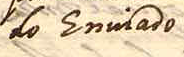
do Enuiado
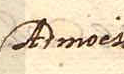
Admoest
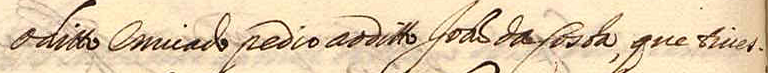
o ditto Enuiado pedio ao ditto João da Costa, que tiues
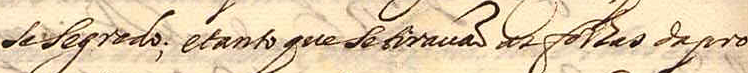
se segredo; e tanto que se tirauão as folhas da pro
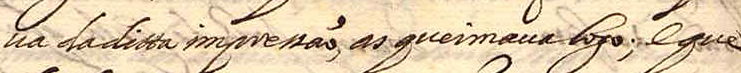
ua da ditta impressaõ, as queimaua logo; e que
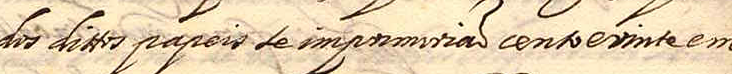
dos dittos papeis se impremeriaõ cento e vinte em
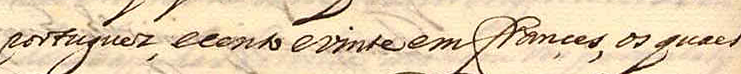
portuguez, e cento e vinte em françes, os quaes
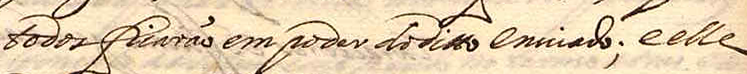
todos ficaraõ em poder do ditto enuiado; e elle
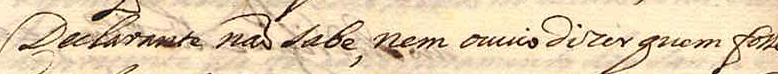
Declarante não sabe, nem ouuio dizer quem fosse
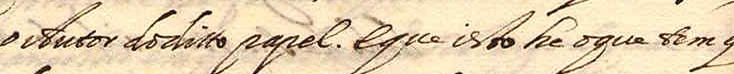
o Autor do ditto papel. e que isto he o que tem q̄
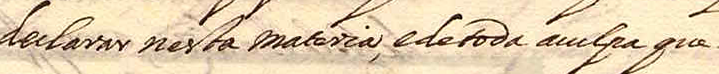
declarar nesta materia, e de toda a culpa que nis
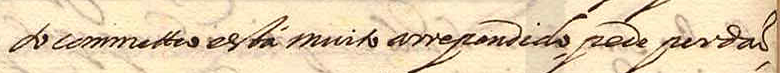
to commetteo está muito arrependido, pede perdaõ,
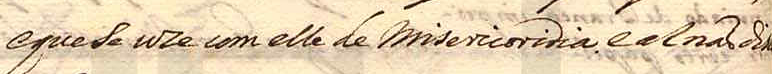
e que se uze com elle de misericoridia e al não diss_
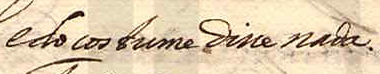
e do costume disse nada.
